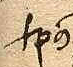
tpꝯ̄
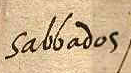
sabbados
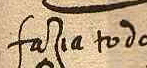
fazia todo
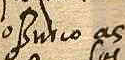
o ꞩuiço as
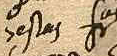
sestas fras
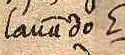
lauādo E
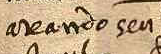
areando seu
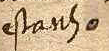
estanho
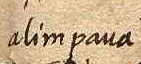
alimpaua
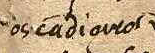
os cādieiros
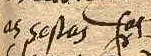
as sestas fras
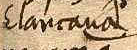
E lançaua
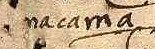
na cama
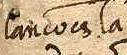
lançoes la
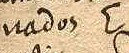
uados E
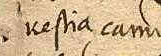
uestia cami
